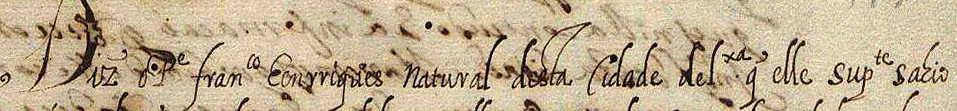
Diz o Pe fran.co henrriques natural desta Cidade de lxa q̄ elle supte sahio
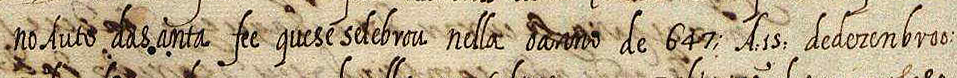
no Auto da santa fee que se selebrou nella o anno de 647. A. 15. de dezenbroo
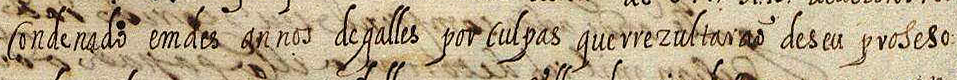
Condenado em des annos de galles por culpas que rrezultaraõ de seu proseso
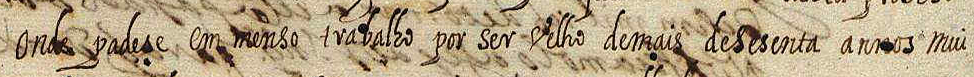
onde padese emmenso trabalho por ser velho de mais de sesenta annos mui
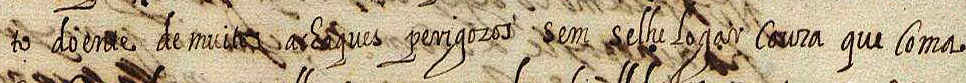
to doente de muito achaques perigozos sem se lhe logar couza que Coma
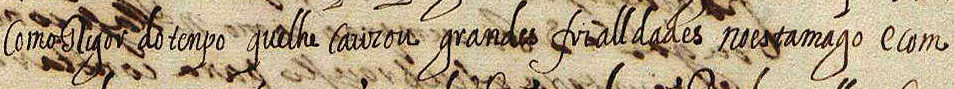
Com o Rigor do tenpo que lhe cauzou grandes frialldades no estamago e com
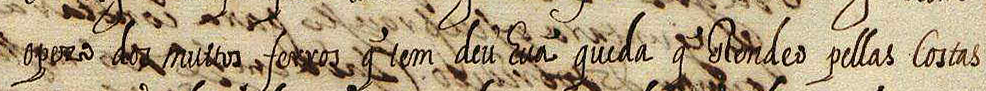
o pezo dos muitos ferros q̄ tem deu huā queda q̄ Rendeo pellas Costas
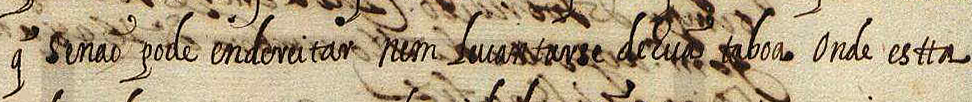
q̄ se naõ pode endereitar nem Leuantarse de huā taboa onde estta
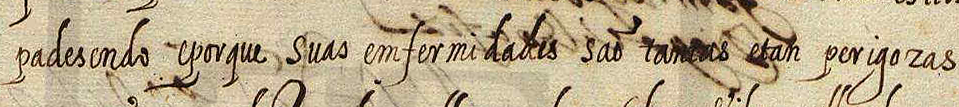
padesendo e porque suas emfermidades saõ tantas e tan perigozas
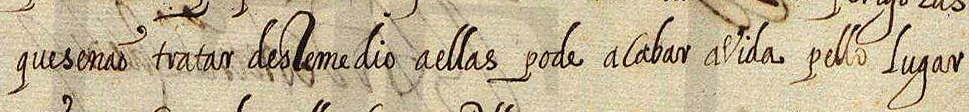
que se naõ tratar de Remedio a ellas pode acabar a vida pello lugar
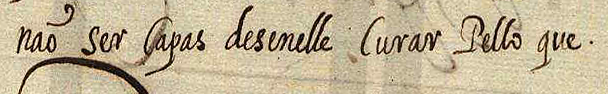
naõ ser Capas de se nelle curar Pello que.
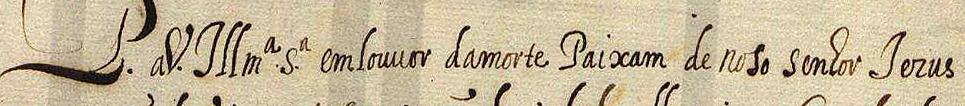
P. a V. Illm.a S.a em louuor da morte Paixam de noso senhor Iezus
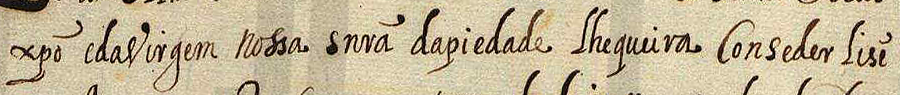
xpō e da Virgem nossa snrā da piedade lhe queira Conseder Lisē
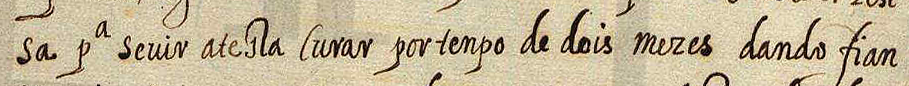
sa pa se uir a testa curar por tempo de dois mezes dando fian
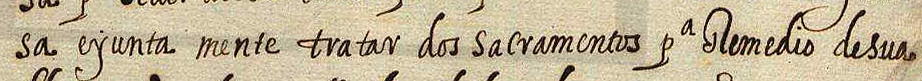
sa e yuntamente tratar dos sacramentos ꝑa Remedio de sua
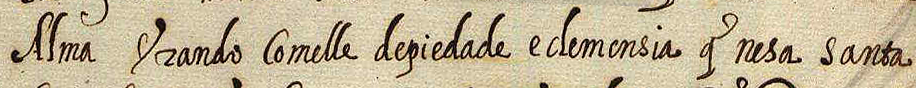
Alma Vzando com elle de piedade e clemensia q̄ nesa santa
